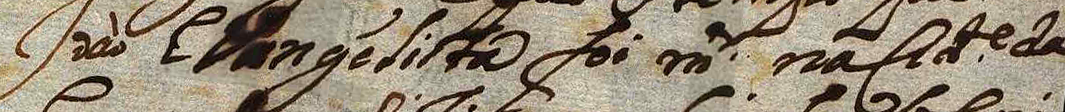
João Evangelista foi mor na Cid̄e da
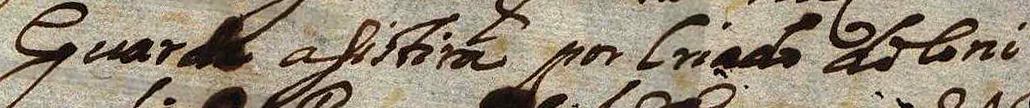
Guarda asistira por Criado do Coni
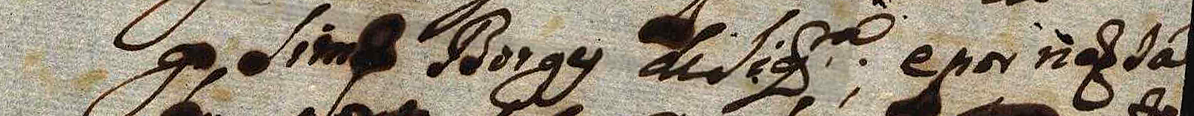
go Simo_ Borges de Siqra; e por naõ sá
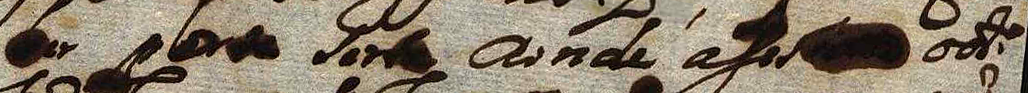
ber para sorte aonde asis_ o d̄.o
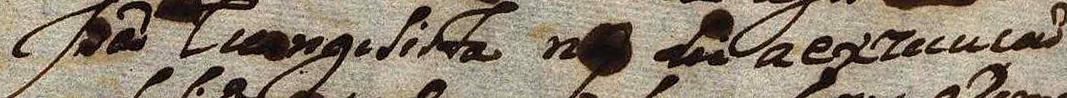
João Euangelista n_ dei a exzeccuçaõ
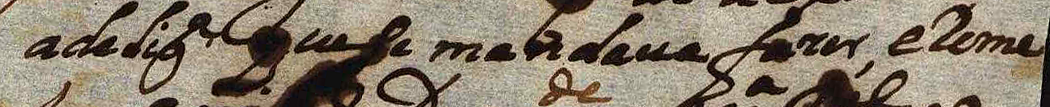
a delig.a que se mandaua fazer, e Reme
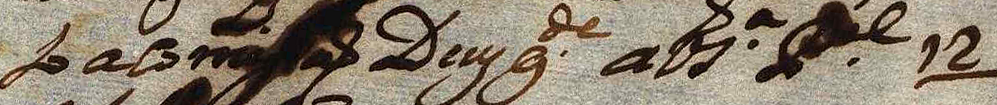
to a comisaõ Deus g.de a VS.a P.al 12
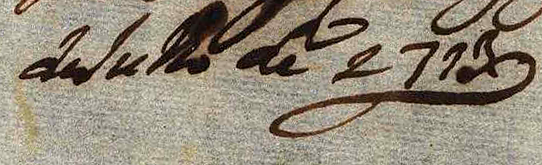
de Iulho de 1713
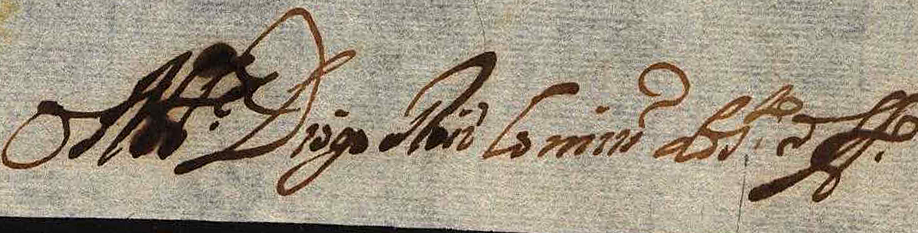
O Alf.e Diogo Roiz̄ Comissō do sto off.o
